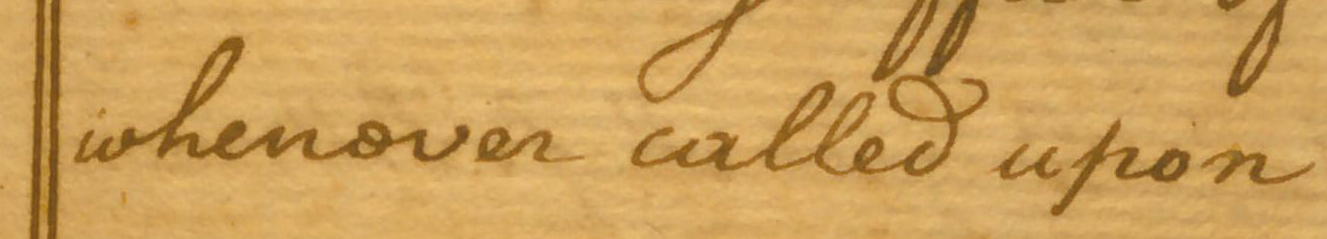whenever called upon
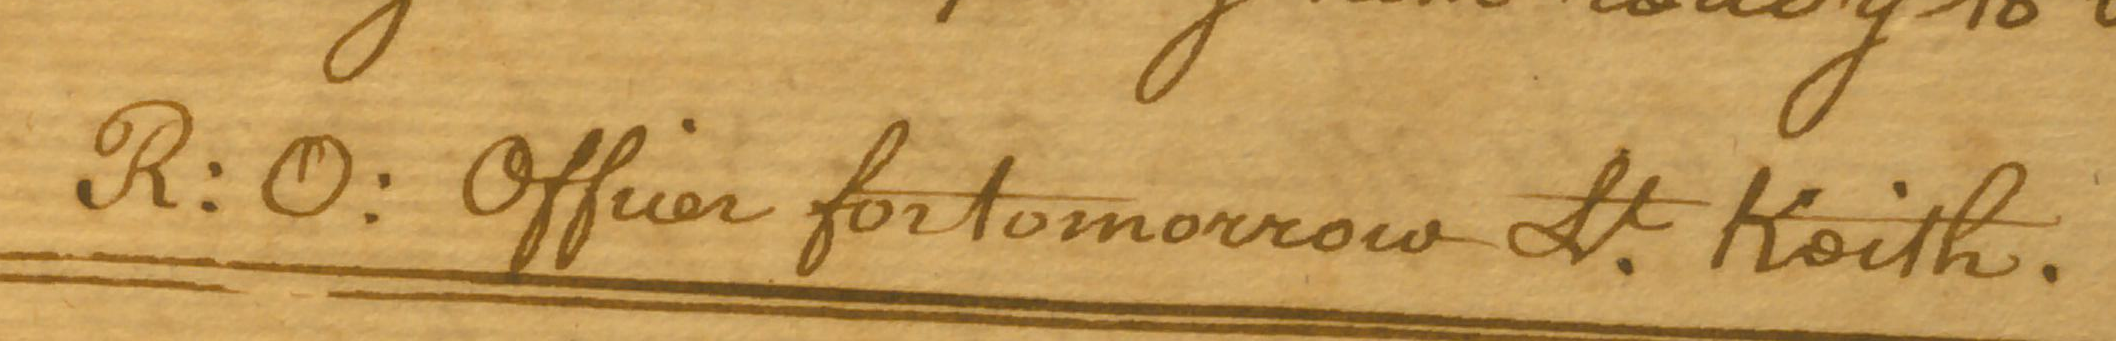R: O: Officer for tomorrow L^t. Keith.
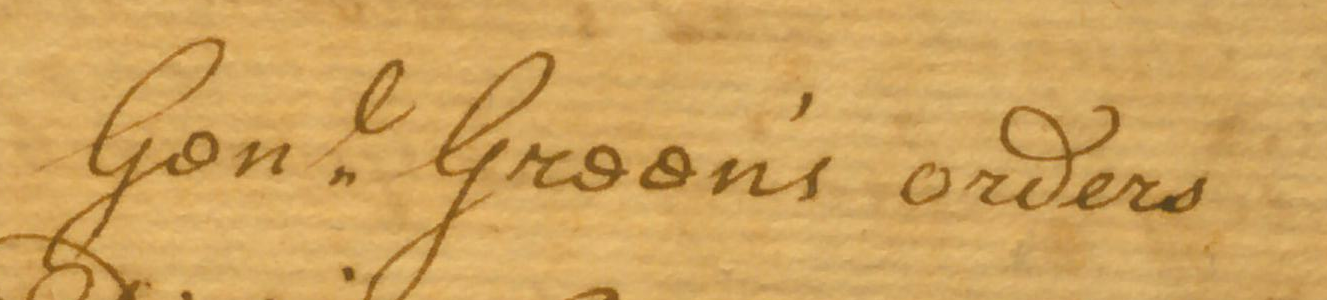Gen^l. Green's orders
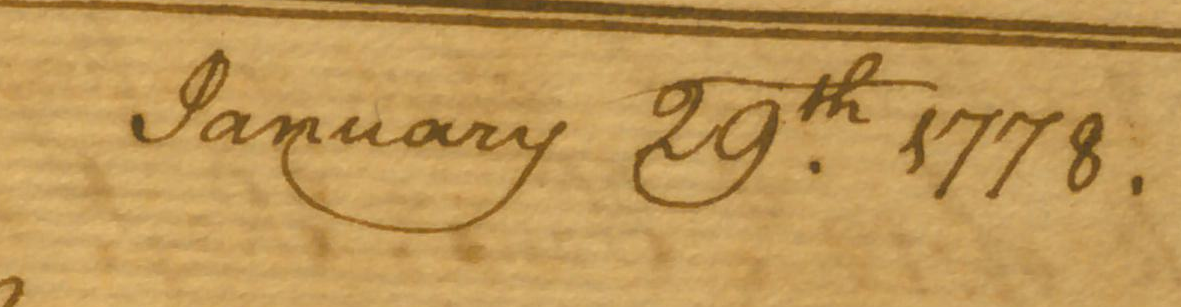January 29^th. 1778.
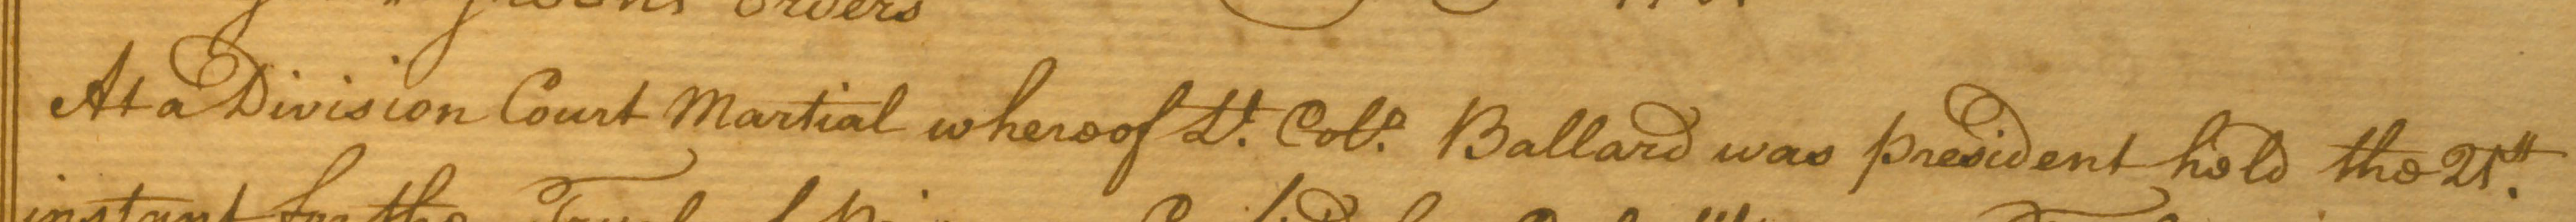At a Division Court Martial whereof L^t. Col^o. Ballard was president held the 25^th.
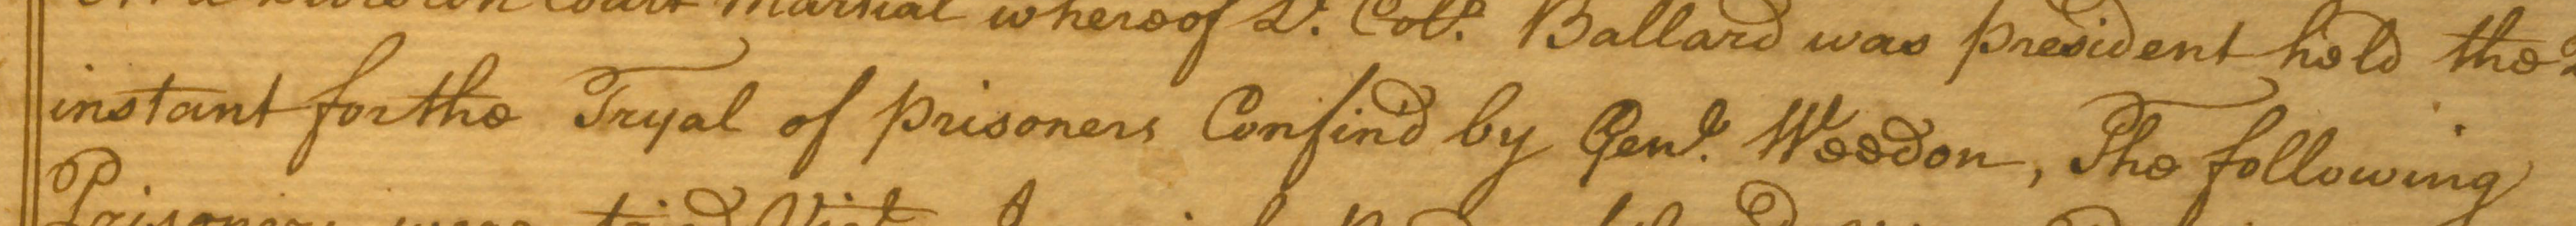instant for the Tryal of prisoners Confin'd by Gen^l. Weedon, The following
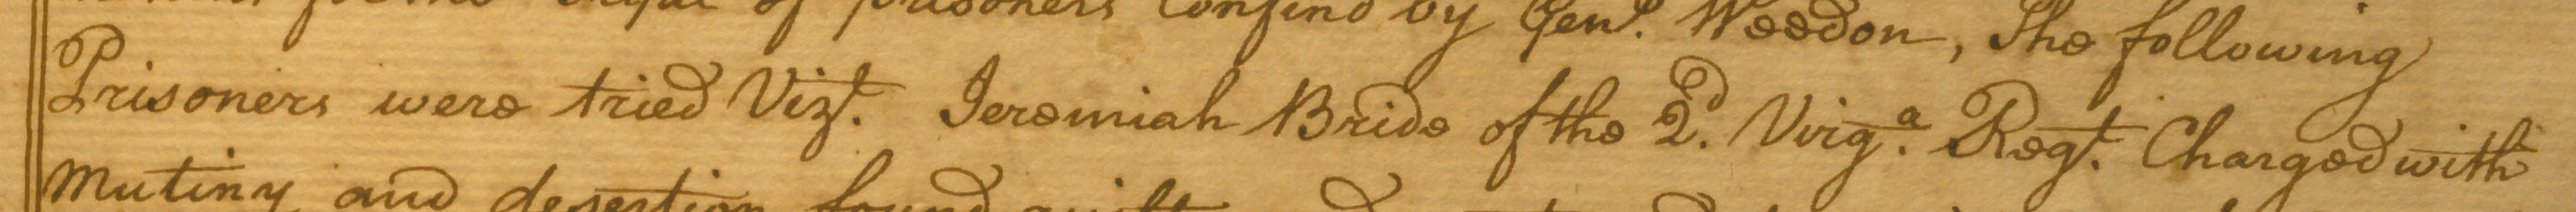Prisoners were tried Viz^t. Jeremiah Bride of the 2^d. Virg^a. Reg^t. Charged with
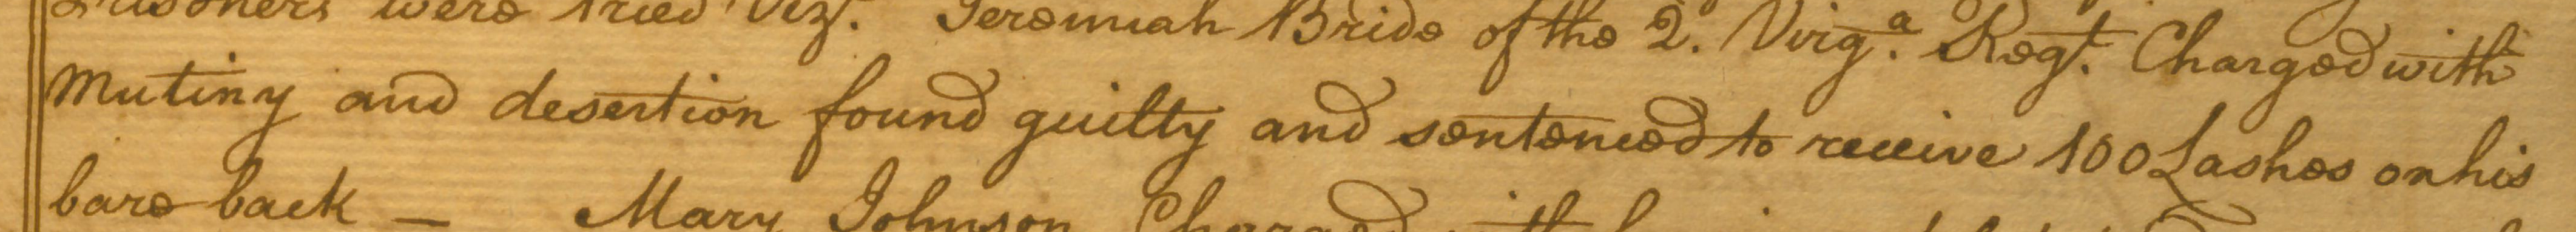munity and desertion found guilty and sentenced to receive 100 Lashes on his
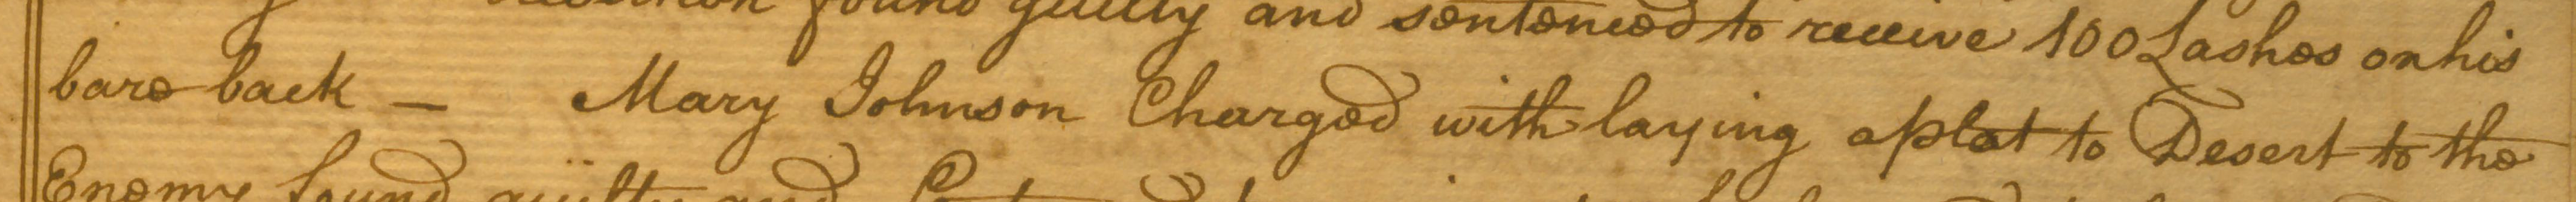bare back- Mary Johnson Charged with laying a plot to Desert to the
